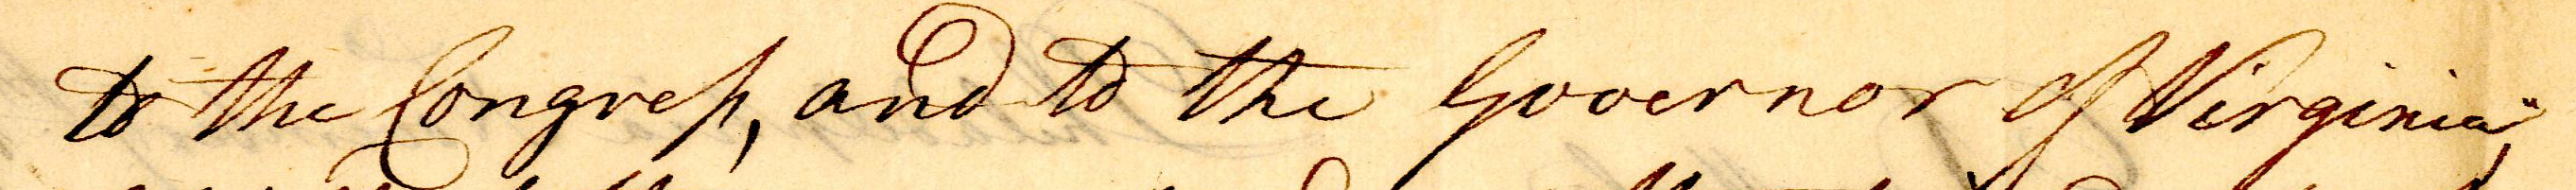to the Congress, and to the Governor of Virginia
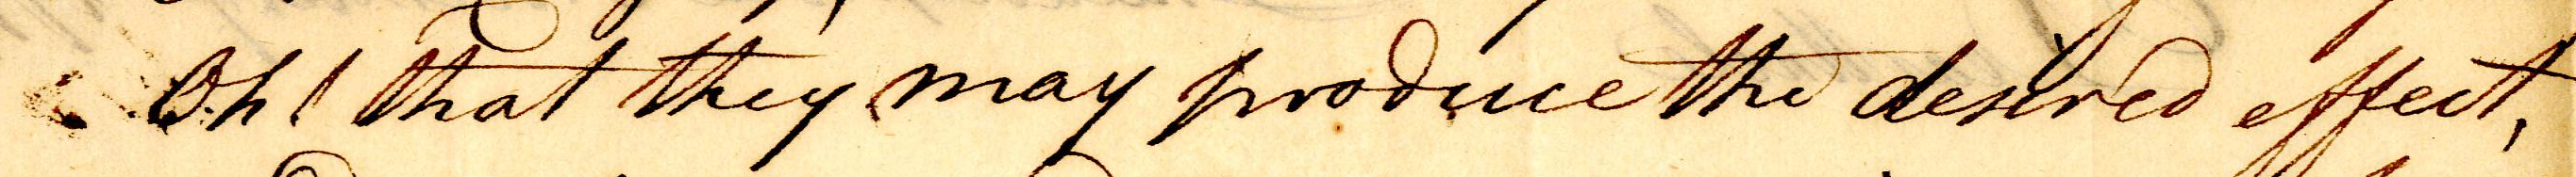Oh! that they may produce the desired effect,
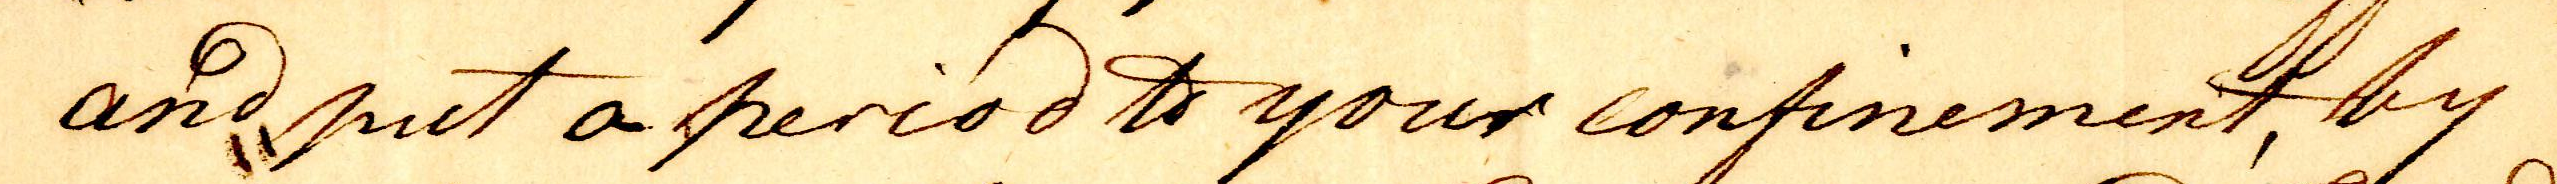and put a period to your confinement, by
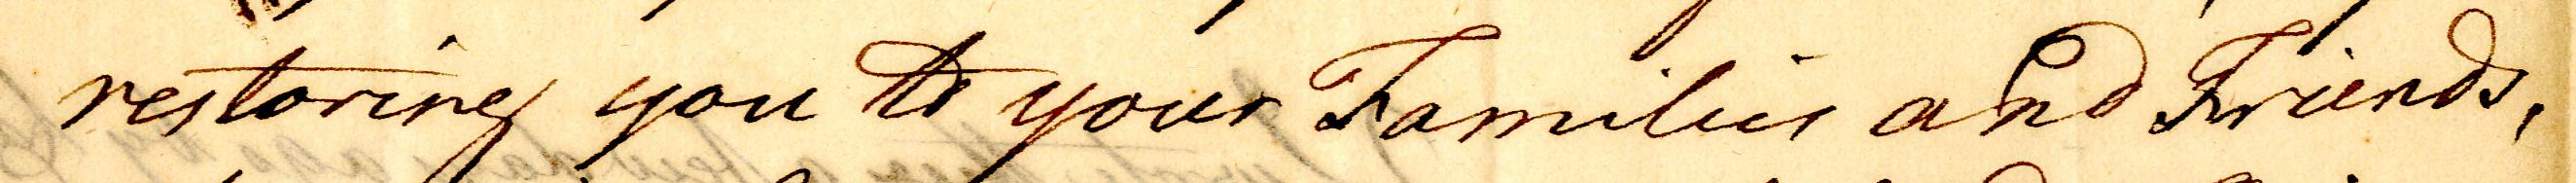restoring you to your Families and Friends,
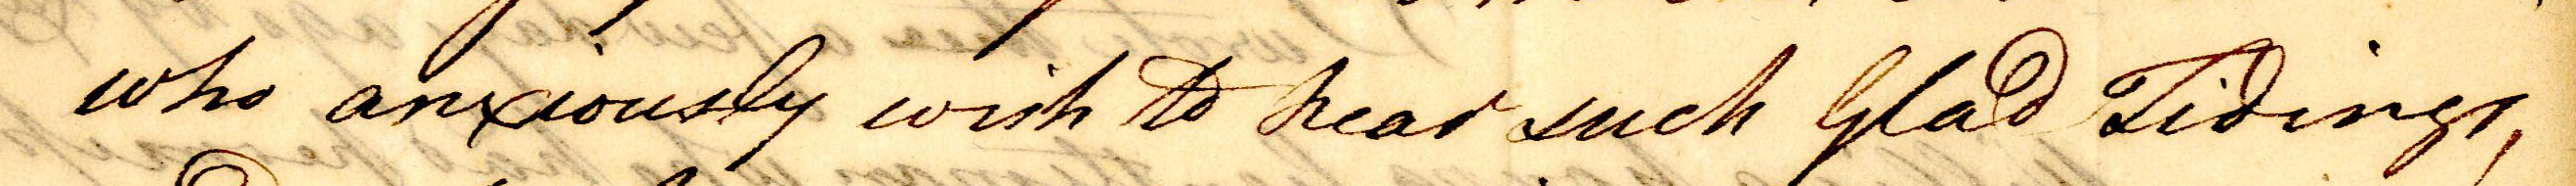who anxiously wish to hear such Glad Tidings,
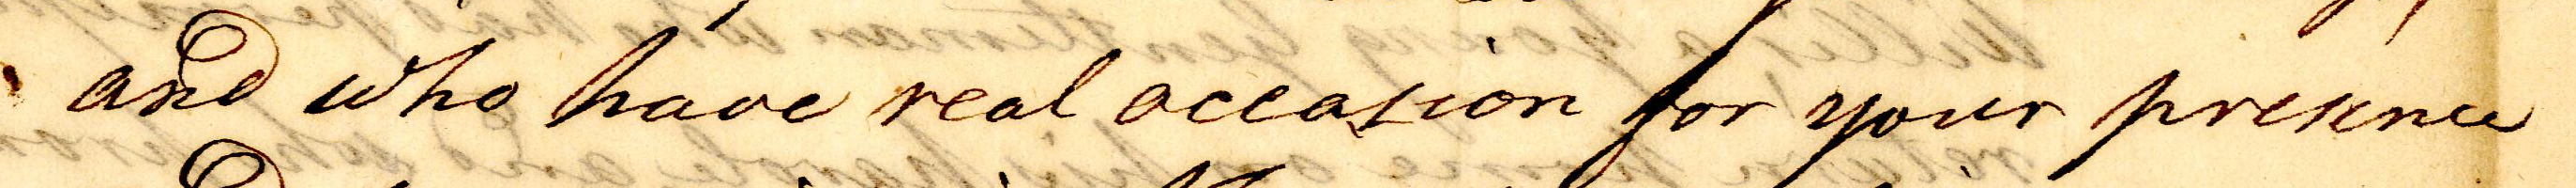and who have real occasion for your presence
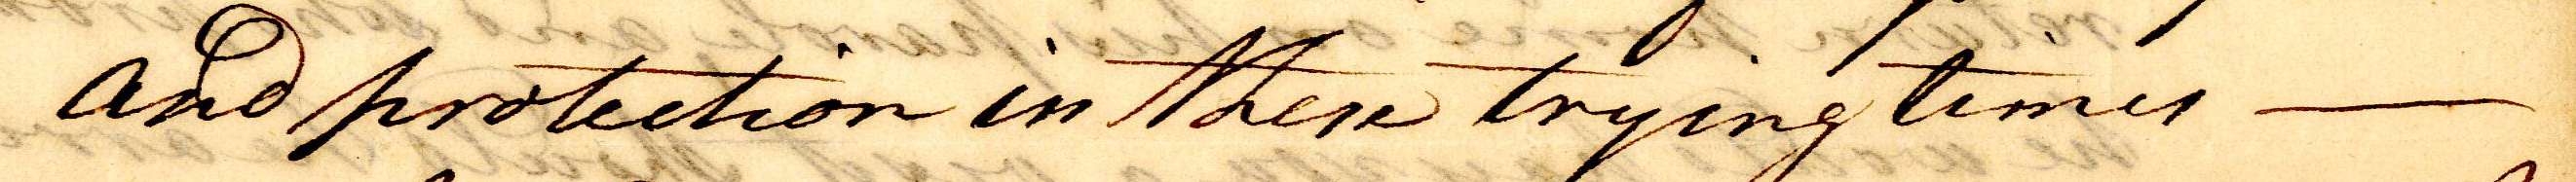and protection in these trying times-
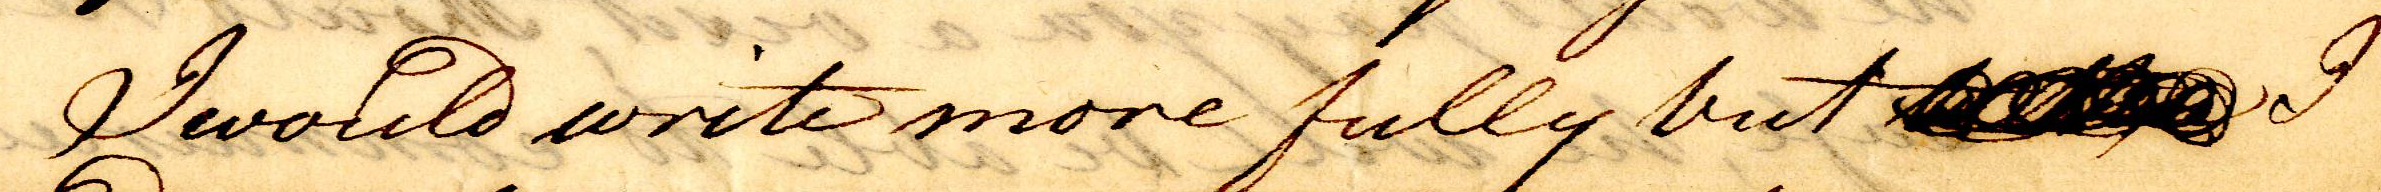I would write more fully but [_____] I
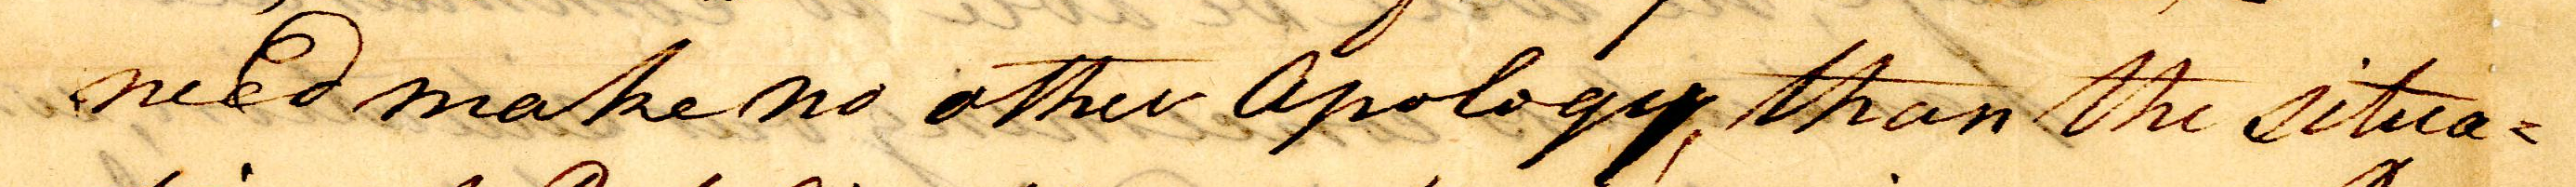need make no other Apology, than the situa-
